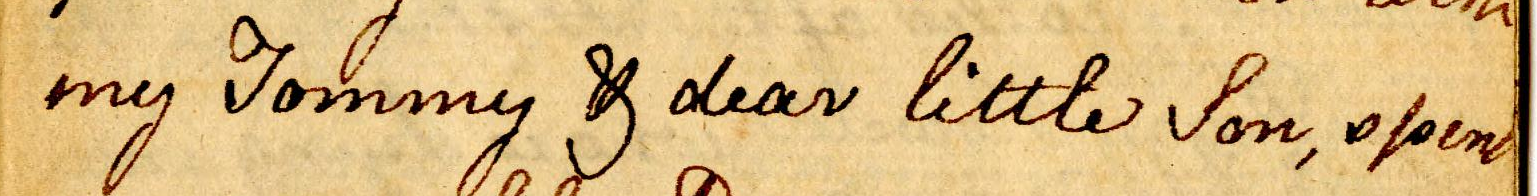my Tommy & dear little Son, spent
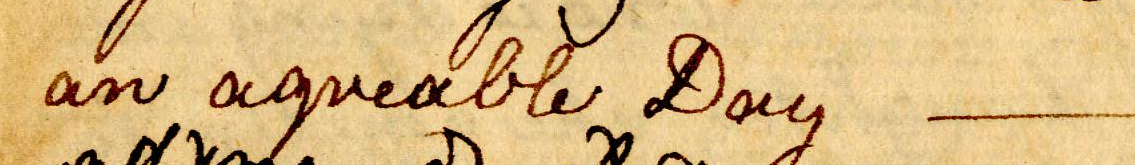an agreable Day-
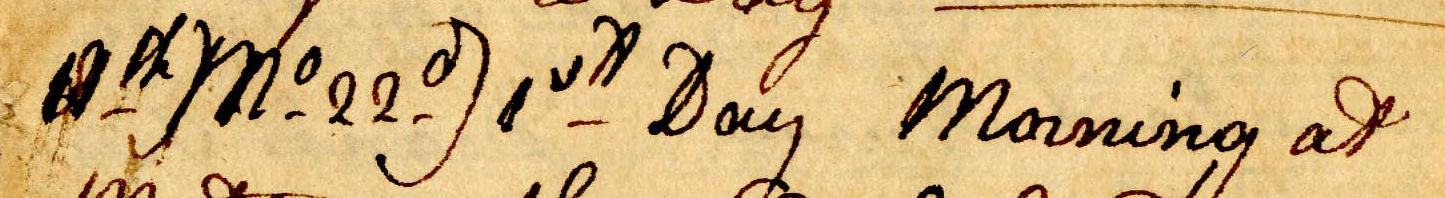11^th M^o 22^d) 1^st Day Morning at
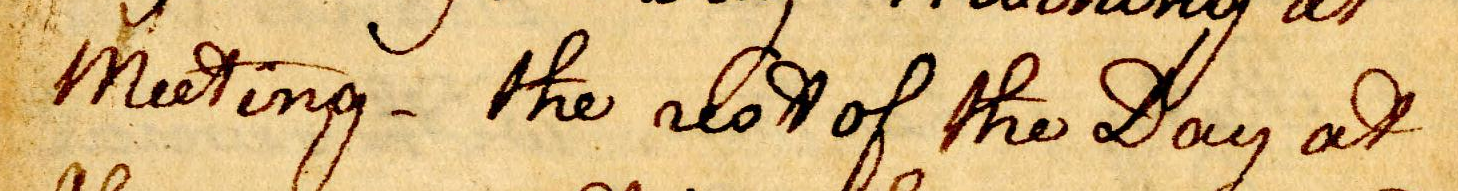Meeting- the rest of the Day at
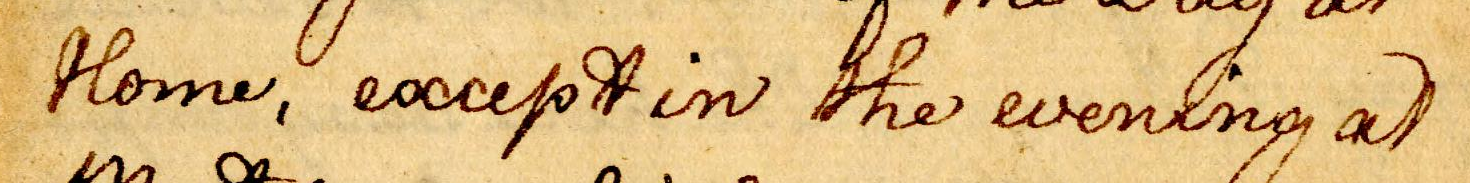Home, except in the evening at
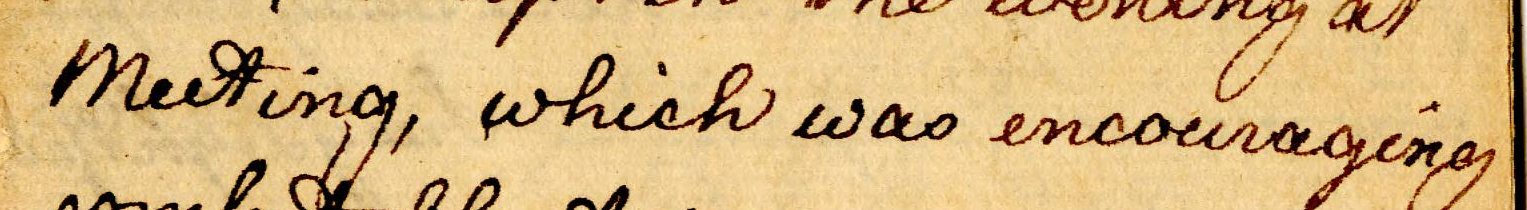Meeting, which was encouraging
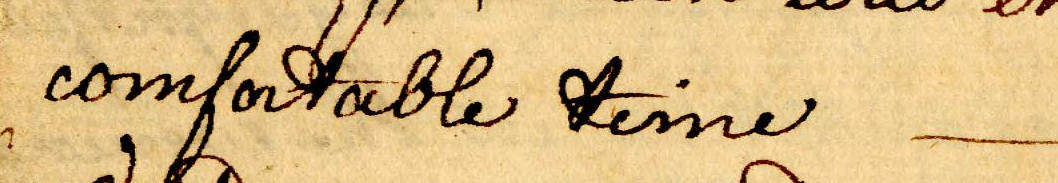comfortable time-
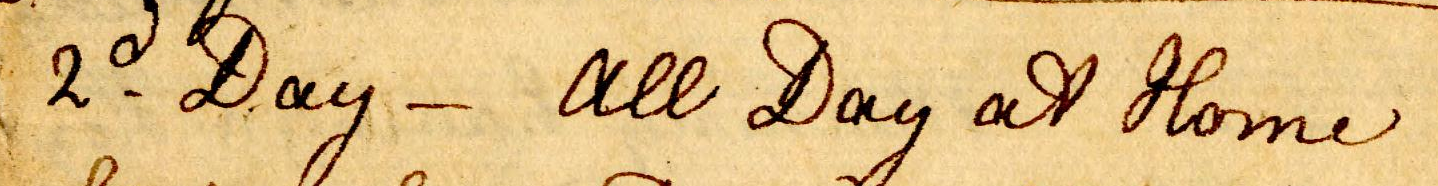2^d. Day- All Day at Home
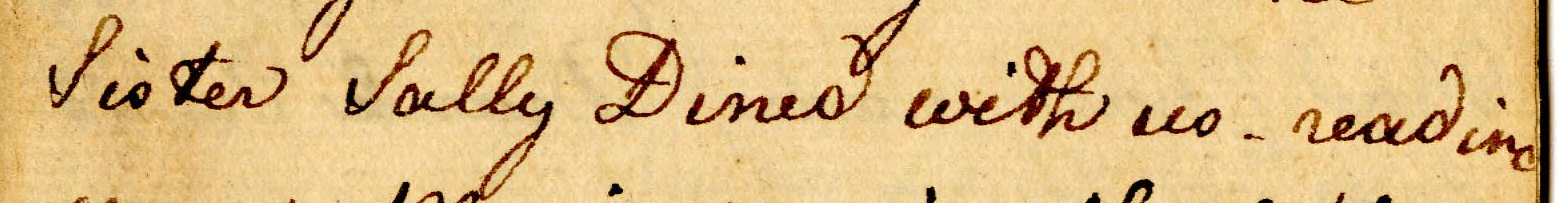Sister Sally Dined with us- readin[g]
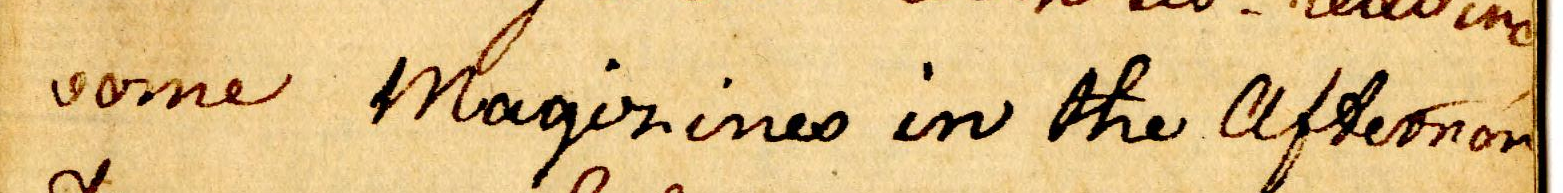some Magizines in the Afternon
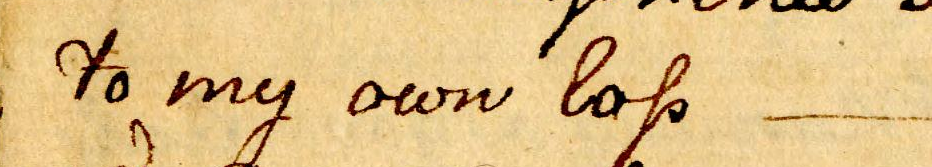to my own loss-
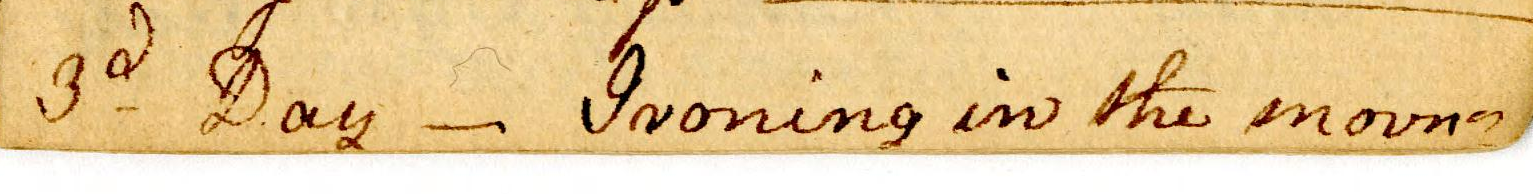3^d Day- Ironing in the morng
